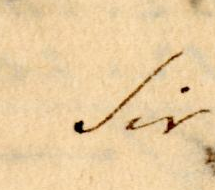Sir
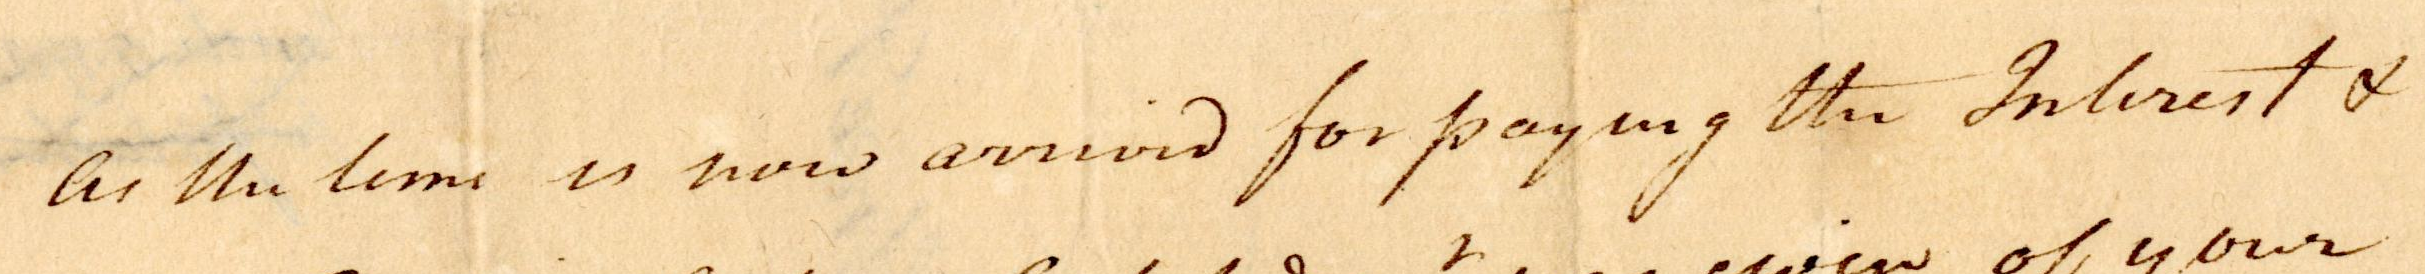as the leins is now arrived for paying the Interest &
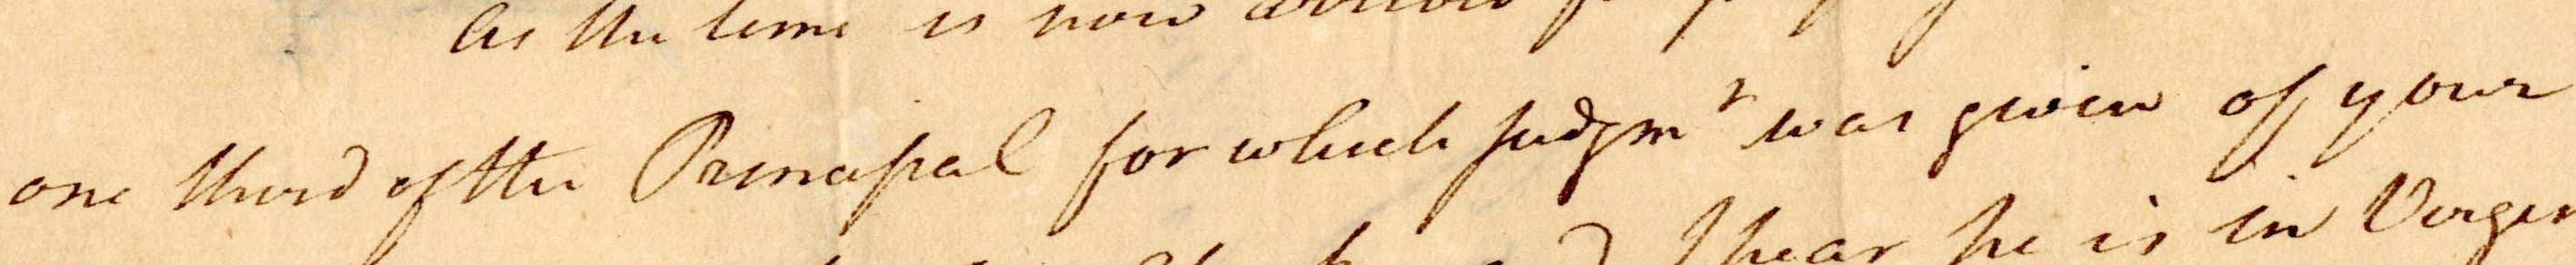one third of the Principal for which judgm^t was given of your
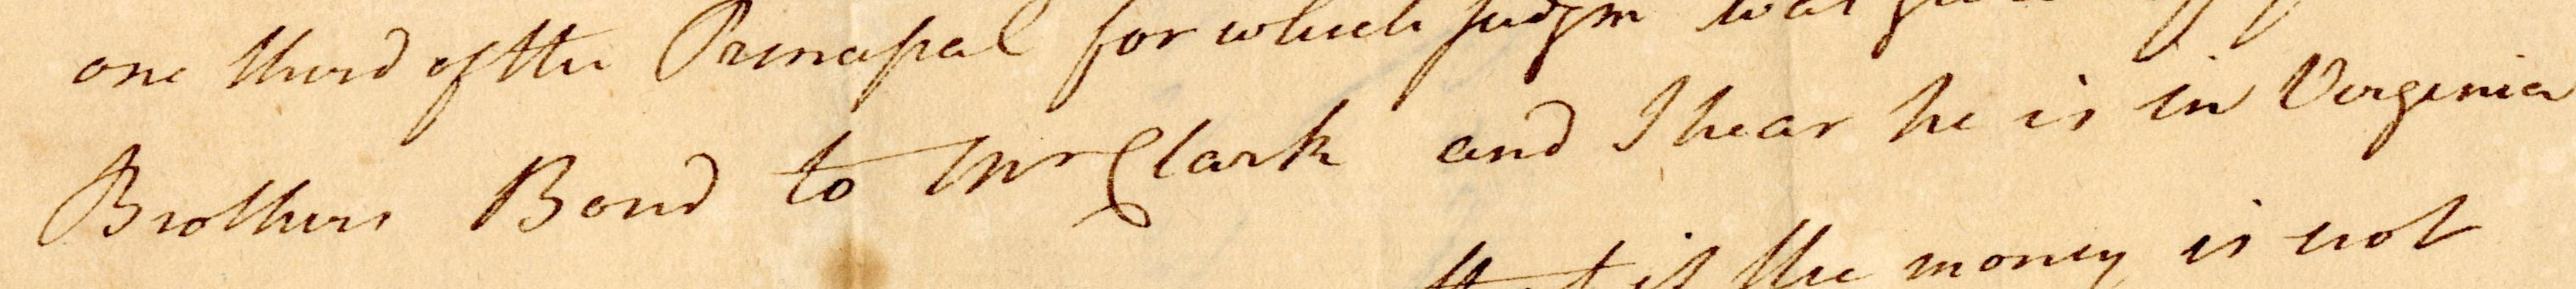Brothers Bond to M^r Clark and I hear he is in Virginia
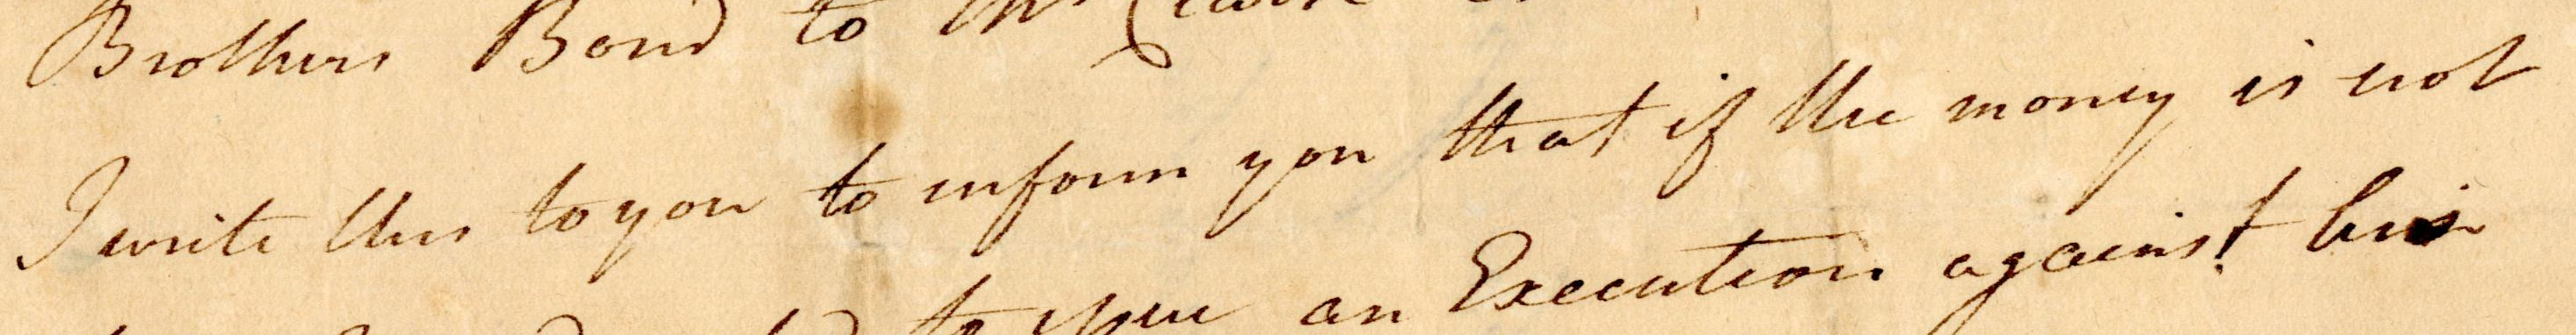I write this to you to inform you that if the money is not
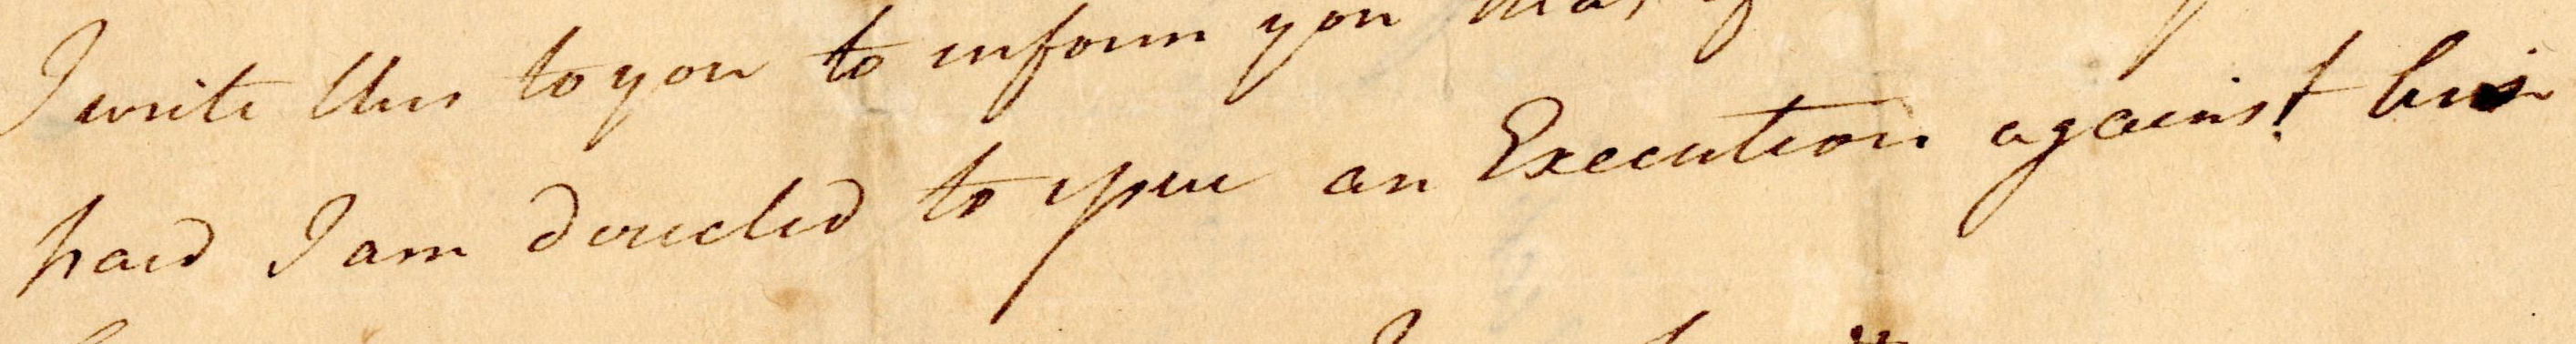had I am directed to you and Execution against his
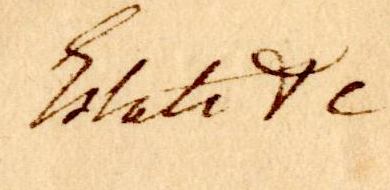Estate
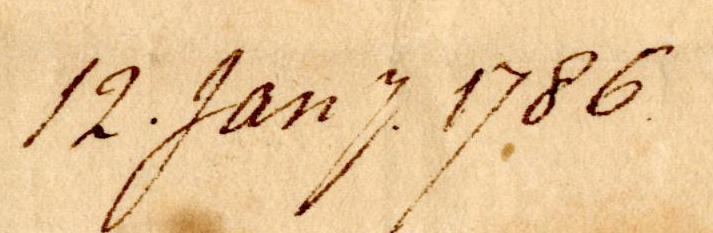12. Jan^y. 1786
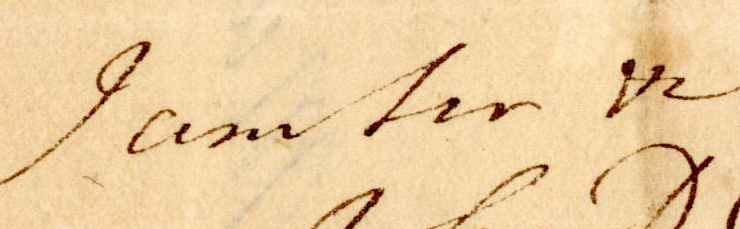I am sir &c
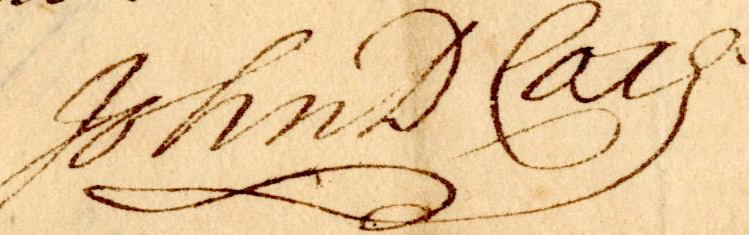John D Case
